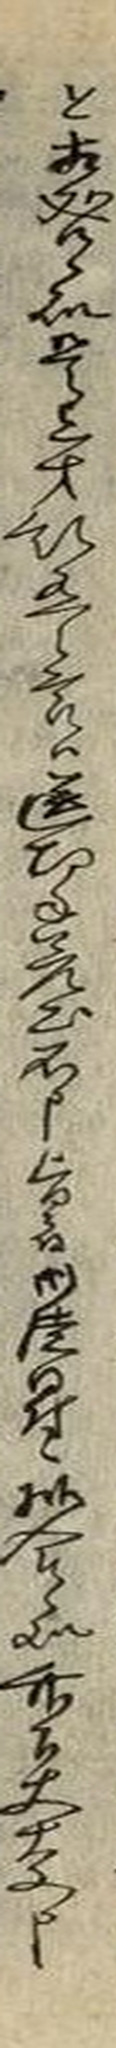と相咎候処是迄才領有之節は送切手差出不申旨に付御徒目付へ掛合候処竹下丈太夫申
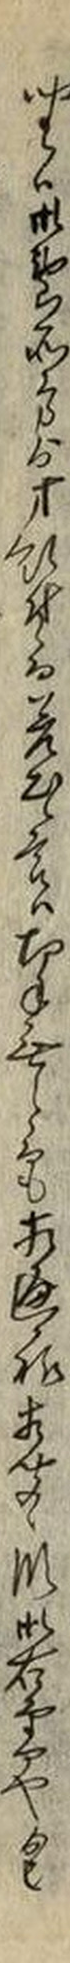聞候は御台所方ゟ才領付候而差出候節は切手無之候而も相通候様相聞候段御右筆部やゟ被
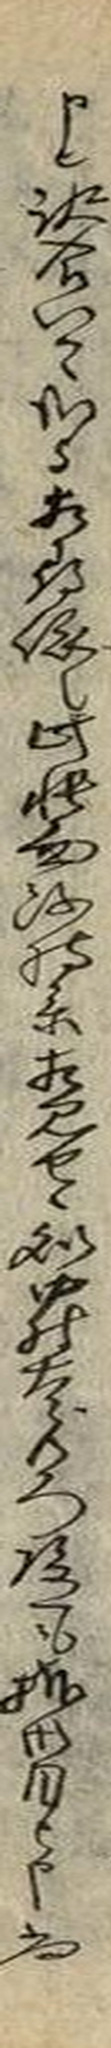申に訳合いかヽ哉と相尋依之此帳面致持参相見せ候処中村太郎左衛門殿へも掛御目被申尚
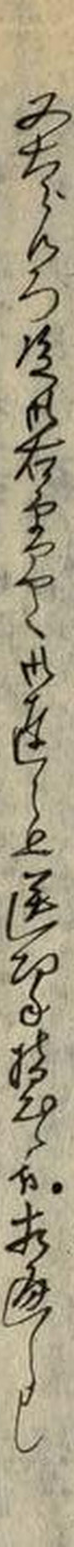又太郎左衛門殿御右筆部やへ御達候上送切手指出候付相通申候
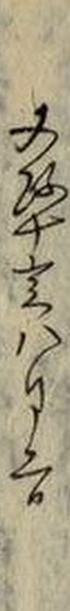文政十亥八月二日当番
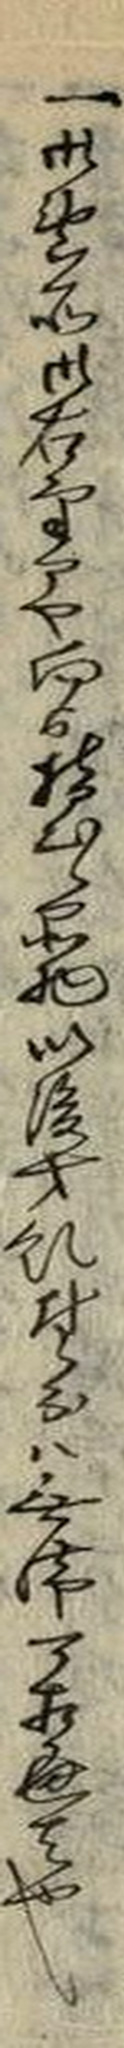一御台所御右筆部や向ゟ指出候品物以後才領付候分は無滞可相通者也
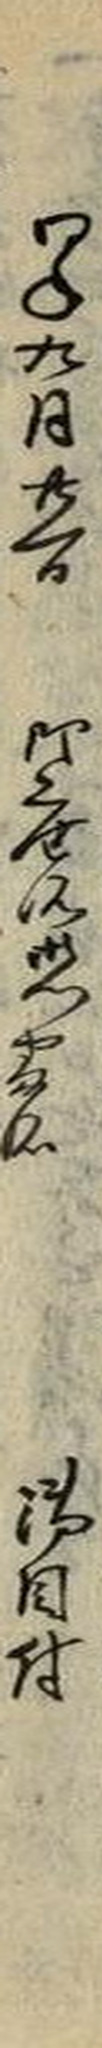同年九月廿一日御座所御門番所御目付
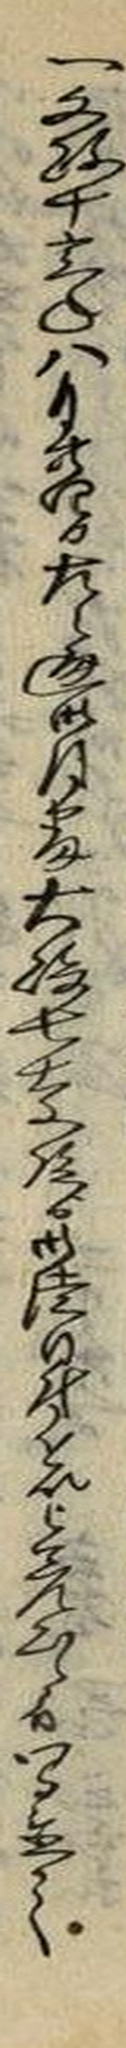一文政十亥年八月廿四日左之通御月番大嶋七太夫殿ゟ御徒目付を以被差出候に付写置之
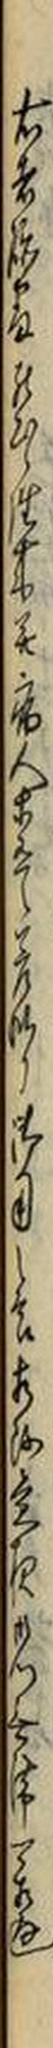右は添番罷出候往来并病人等有之差掛り御用之節相改昼夜御門無滞可相通
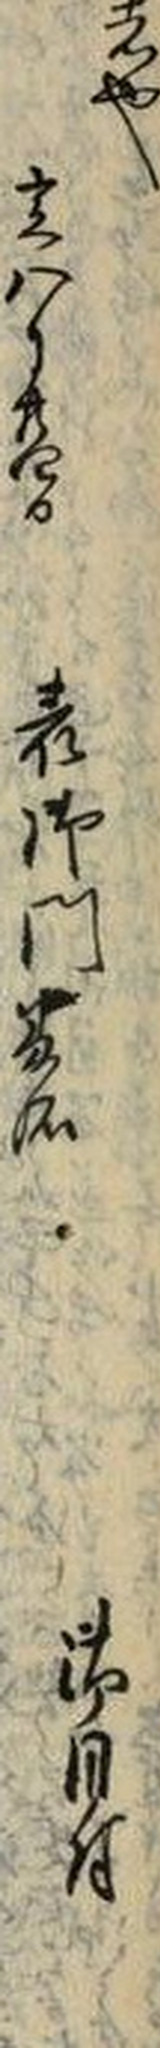亥八月廿四日表御門番所御目付
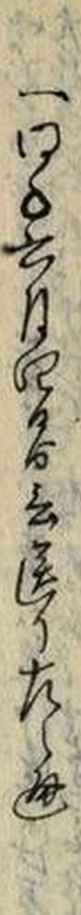一同年六月四日ゟ言送り左之通
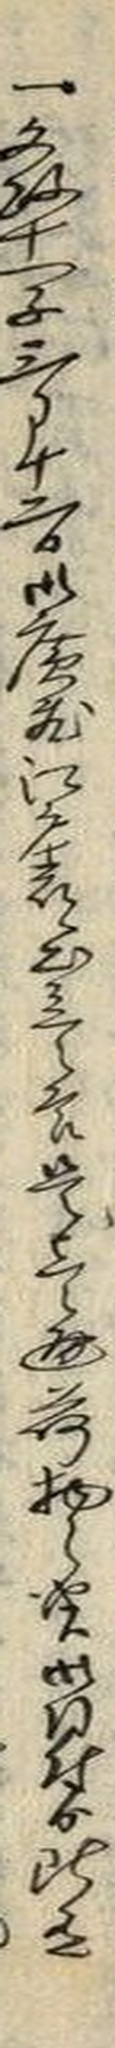一文政十一子三月十二日御広敷江戸表出立之節是迄之通荷物之儀は御目付ゟ断有
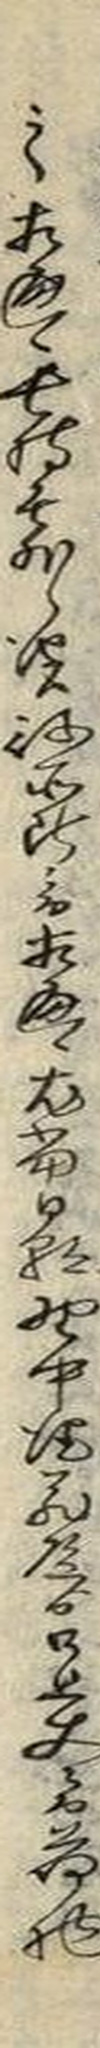之相通候長持其外之儀は役所断ニ而相通候尤当日朝野中徳蔵殿ゟ口上使に而荷物
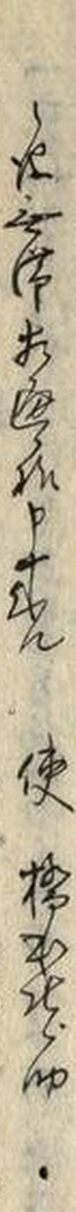之儀無滞相通候様申来ル使橋本次郎助当番
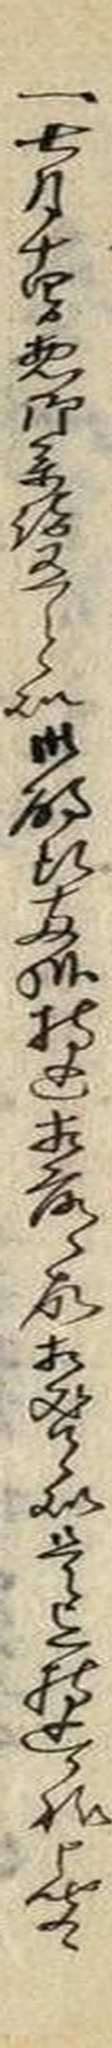一七月十四日惣御参詣有之候処御触頭両掛持込相落候故相咎候処是迄持込候様申聞候
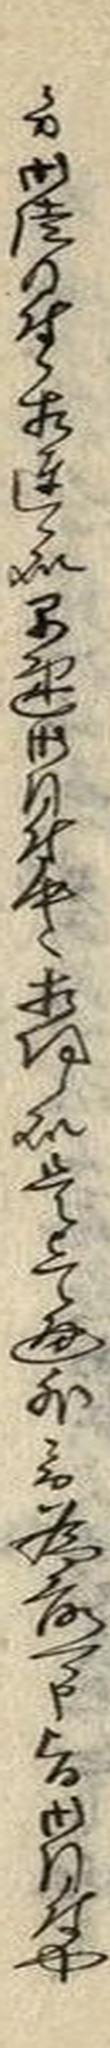に付御徒目付へ相達候処早速御目付中へ相伺候処是迄之通外に而為落可申旨御目付中
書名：御門御櫓之部
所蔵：福井県文書館 Fukui Prefectural Archives
